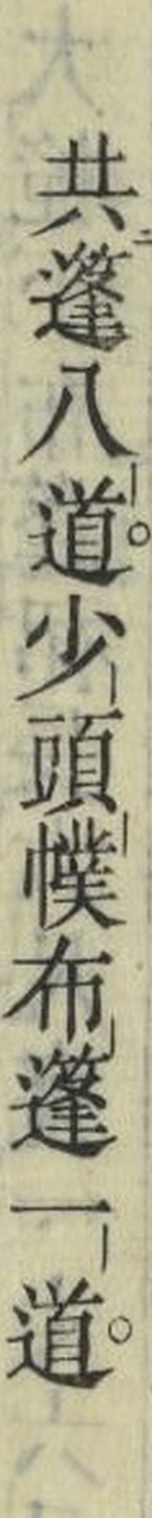共篷八-道。少-頭-幞布-篷一-道。
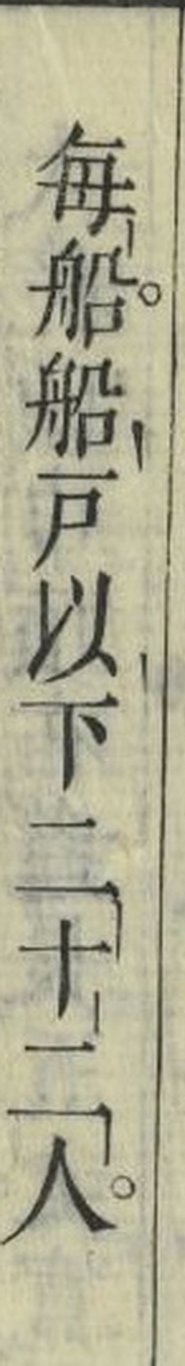每-船。船-戸以-下二-十-二-人。
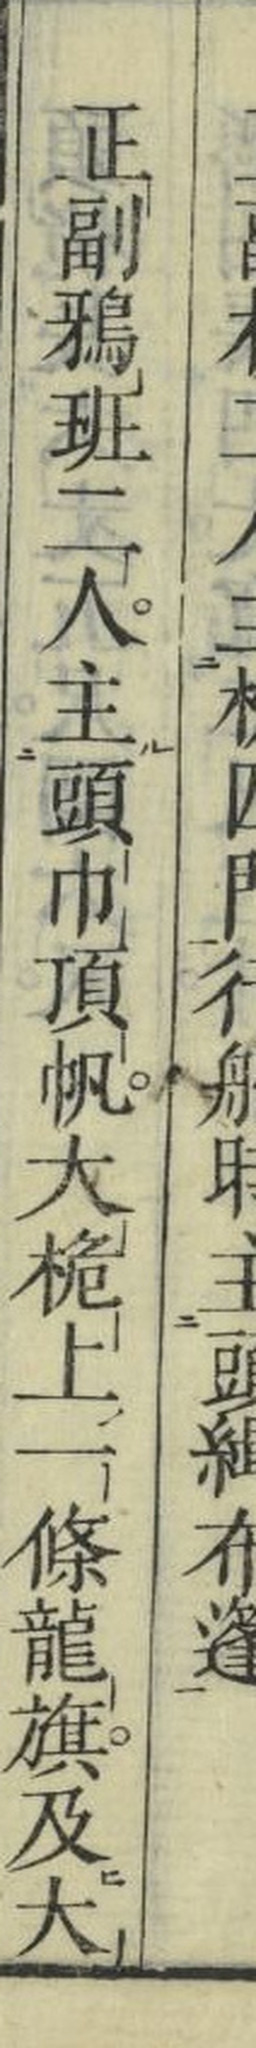正-副鴉-班二-人。主頭-巾-頂-帆。大-桅-上一-條龍-旗。及大-
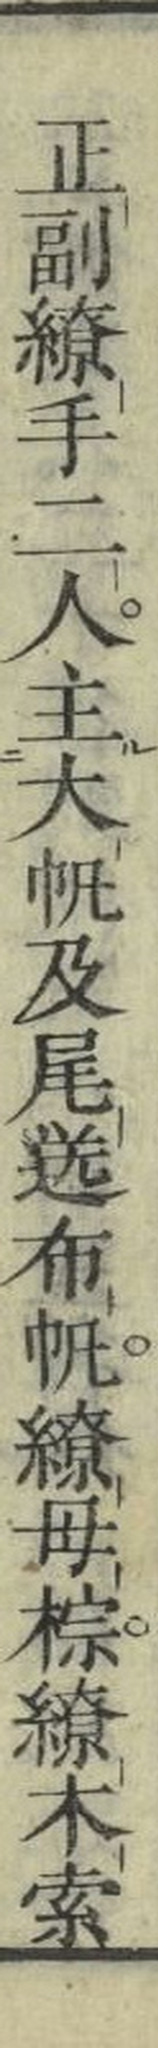正-副繚-手二-人。主大-帆及尾-送布-帆。繚-母-棕。繚-木-索

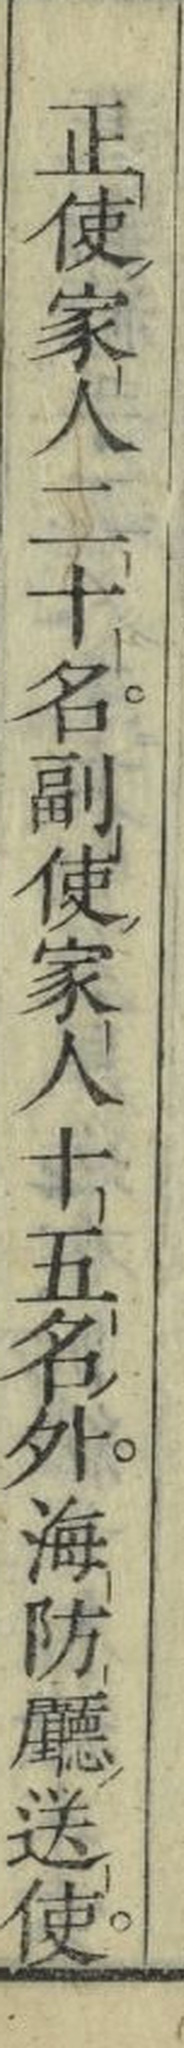正-使家-人二-十-名。副-使家-人十-五-名外。海-防-㕔送-使。
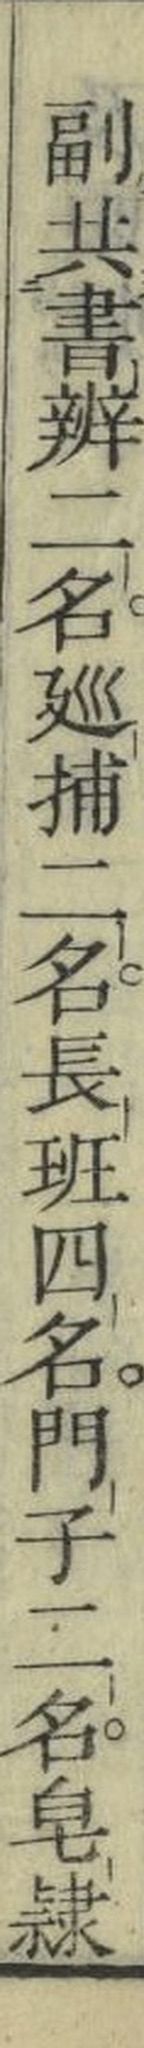副共書-辨二-名。廵-捕二-名。長-班四-名。門-子二-名。皂-隷
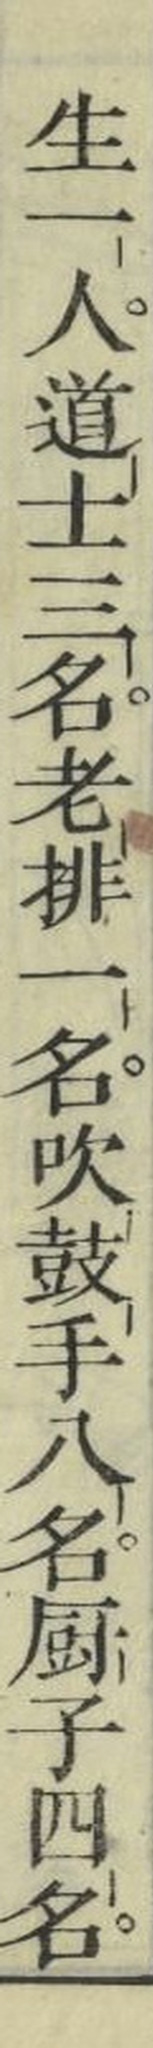生一-人。道-士三-名。老-排一-名。吹-鼓-手八-名。厨-子四-名。
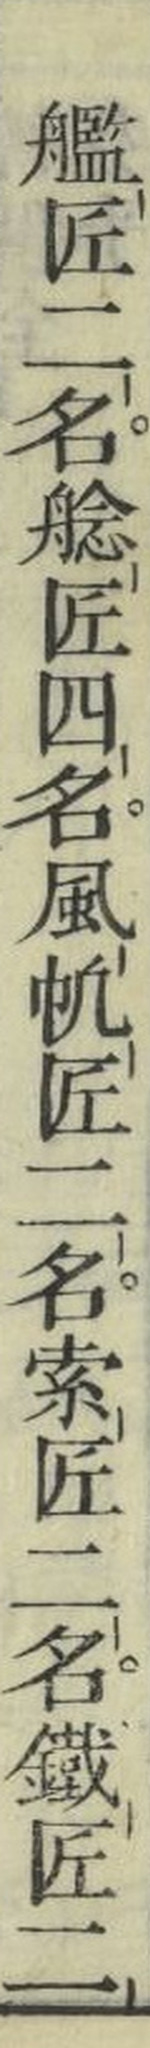艦-匠二-名。艌-匠四-名。風-帆-匠二-名。索-匠二-名。鐵-匠二-
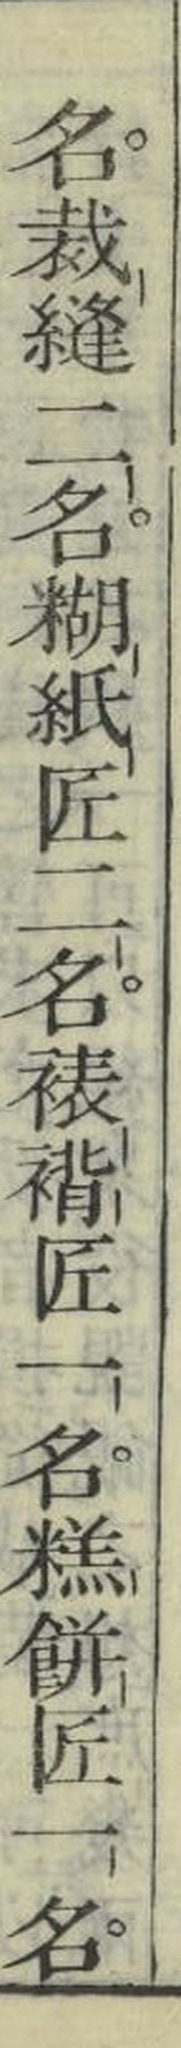名。裁-縫二-名。糊-紙-匠二-名。裱-褙-匠一-名。糕-餅-匠一-名。

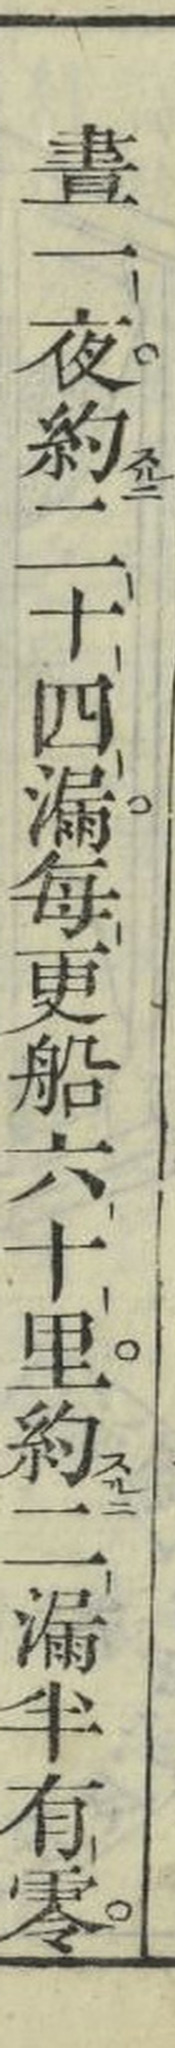晝一-夜。約二-十-四-漏。每-更船六-十-里。約二-漏半有-零。

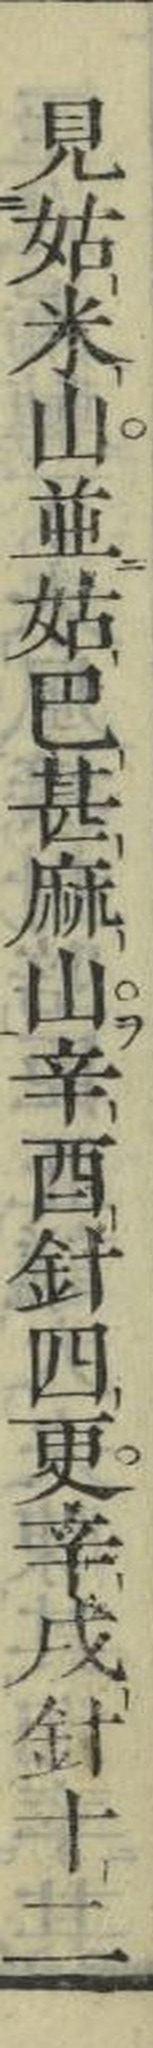見姑-米-山。並姑-巴-甚-麻-山。辛-酉-針四-更。辛-戌-針十-二
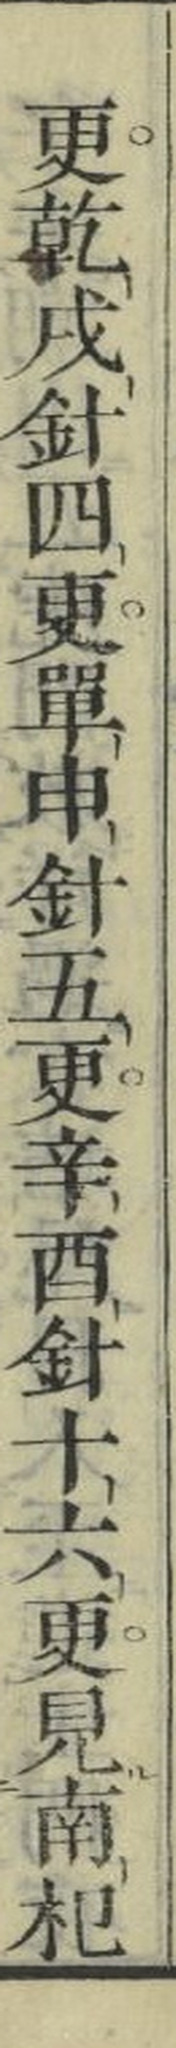更。乾-戌-針四-更。單-申-針五-更。辛-酉-針十-六-更。見南-杞
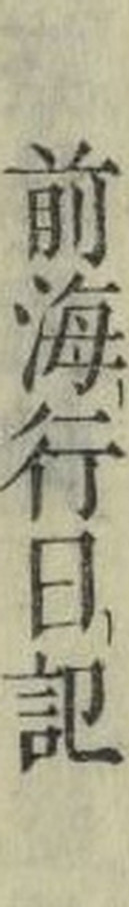前海-行日-記

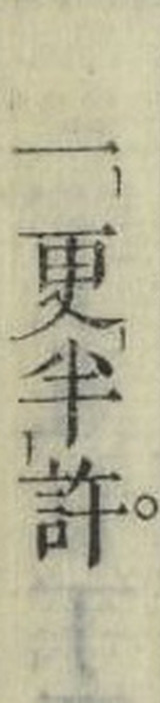一-更-半-許。

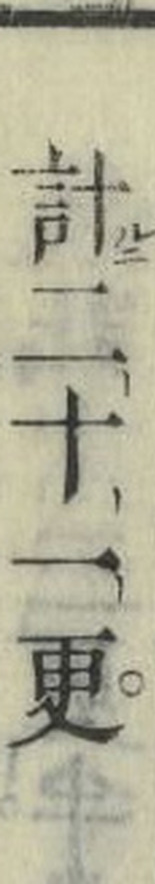計二-十-一-更。
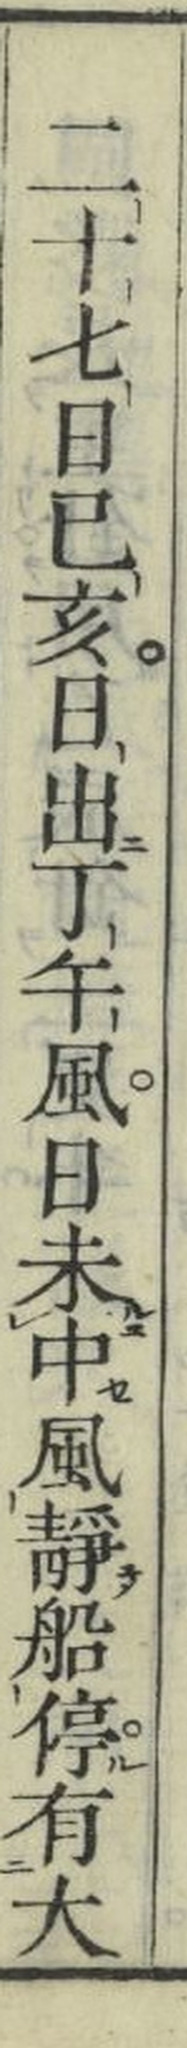二-十-七-日巳-亥。日-出丁-午-風。日未中風-靜船-停。有大
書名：中山伝信録 巻一
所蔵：University of the Ryukyus Library
